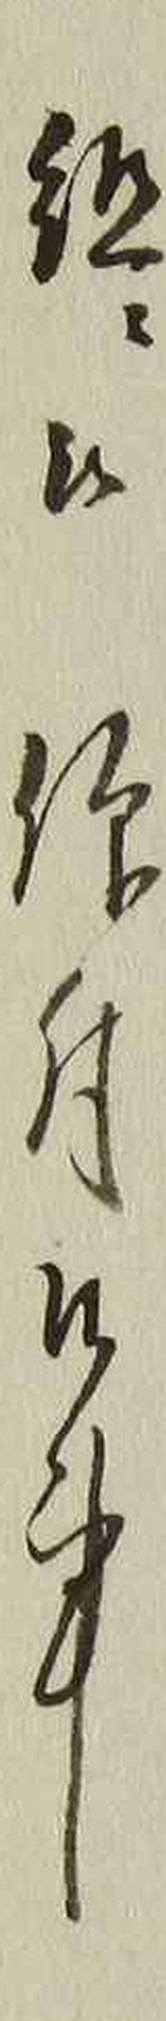組ニ被仰付候事
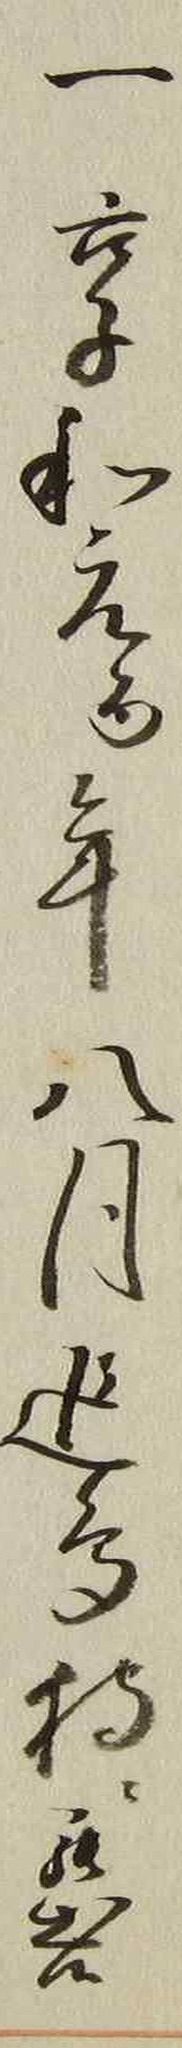一享和元酉年八月追鳥狩ニ罷出候
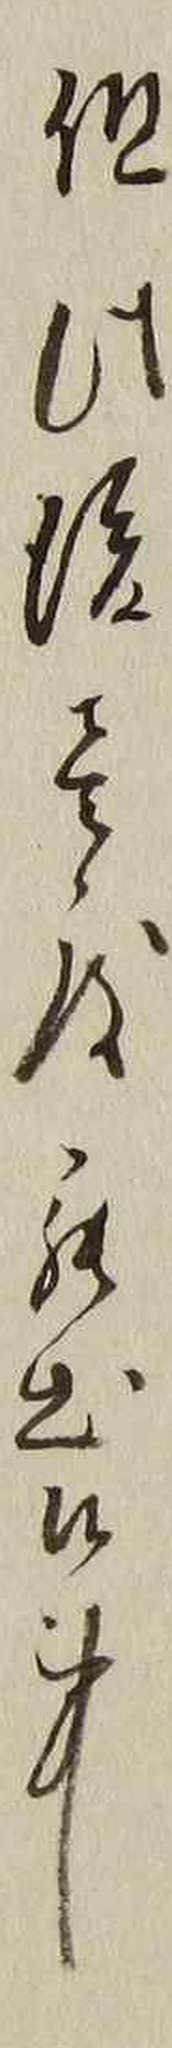但此後壱度罷出候事
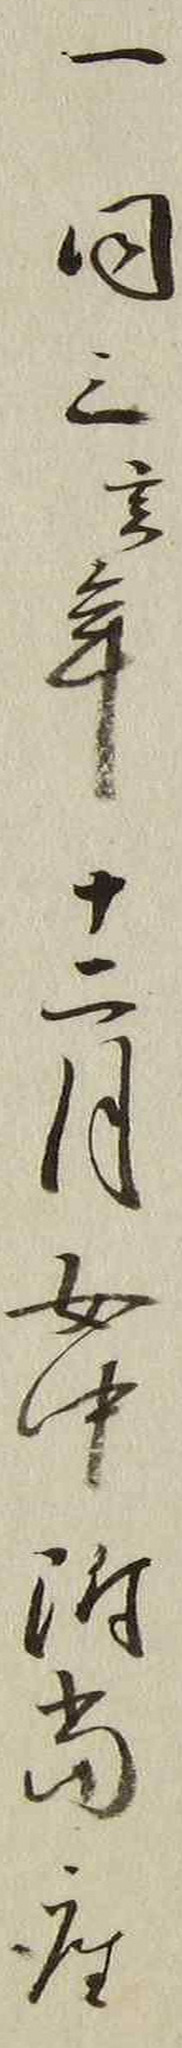一同三亥年十二月女中附当座
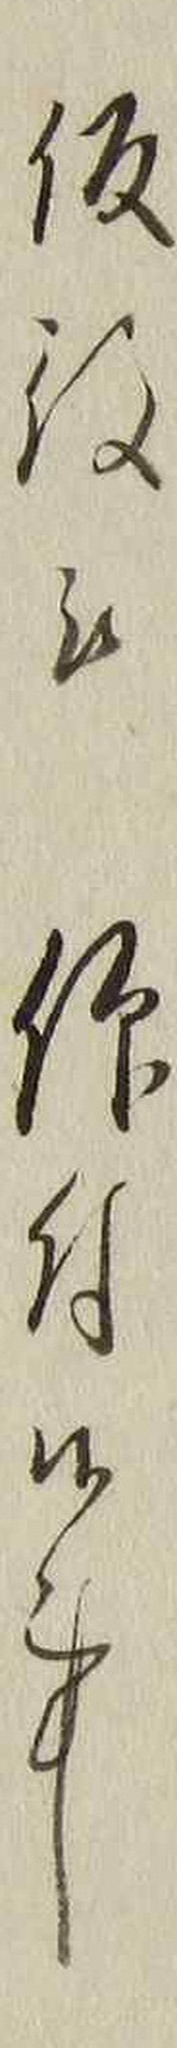仮役被仰付候事
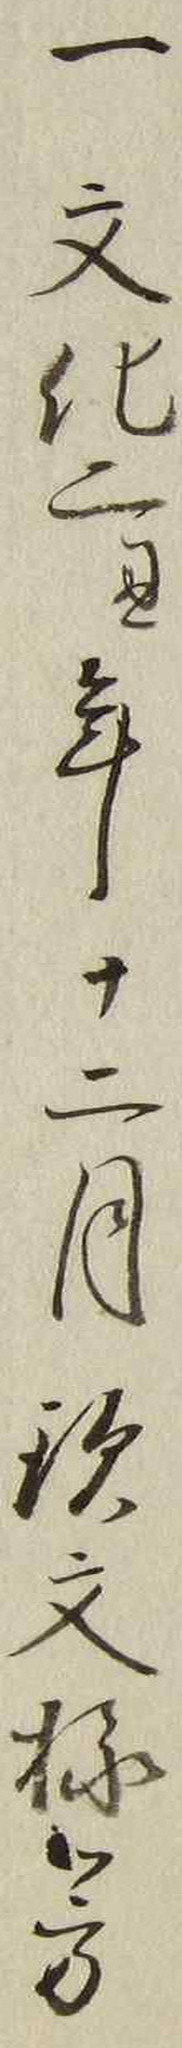一文化二丑年十二月欽文様御方
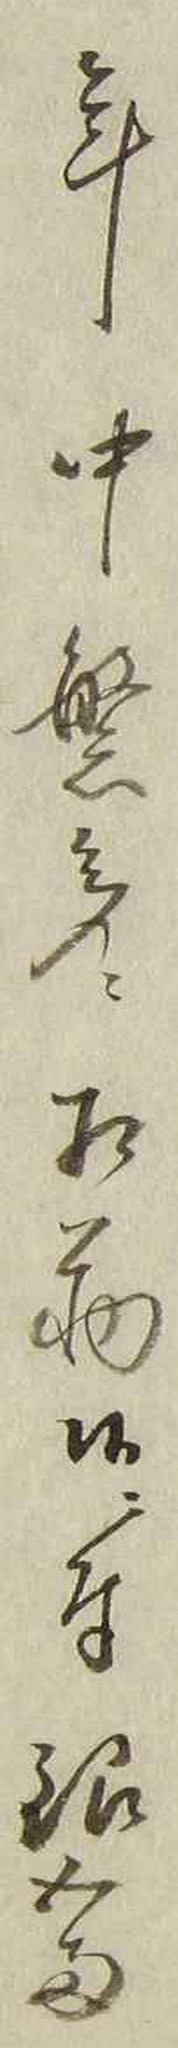年中繁多ニ相勤候ニ付銀五両
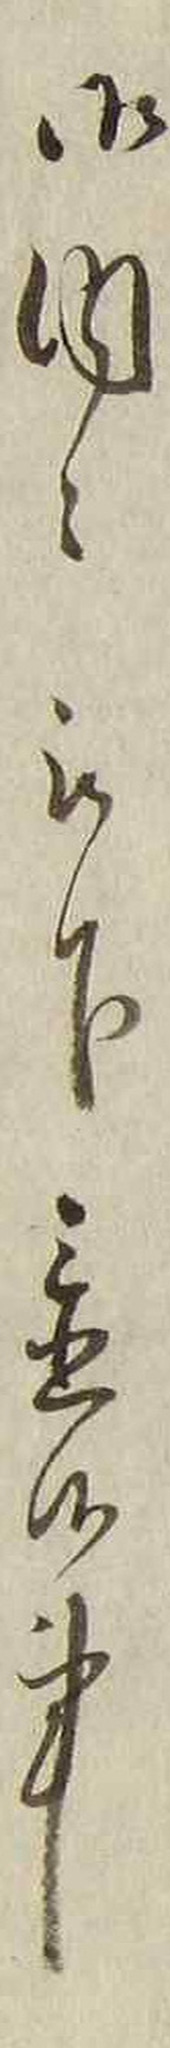御内々被下置候事

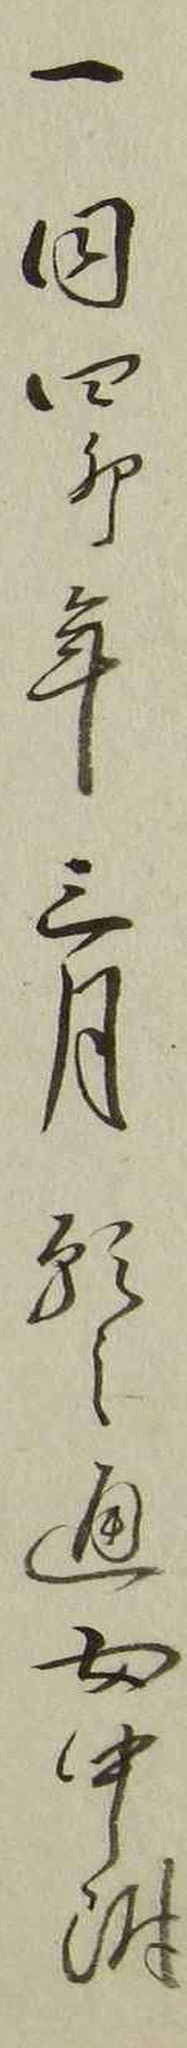一同四卯年三月願之通女中附
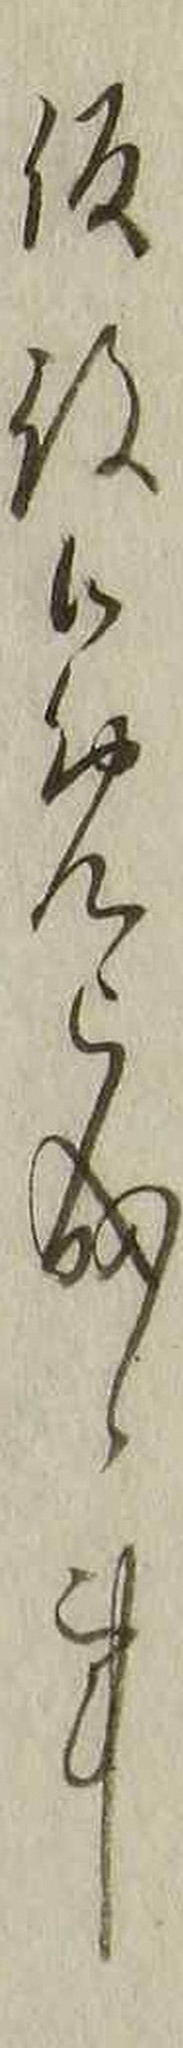仮役御免被成候事
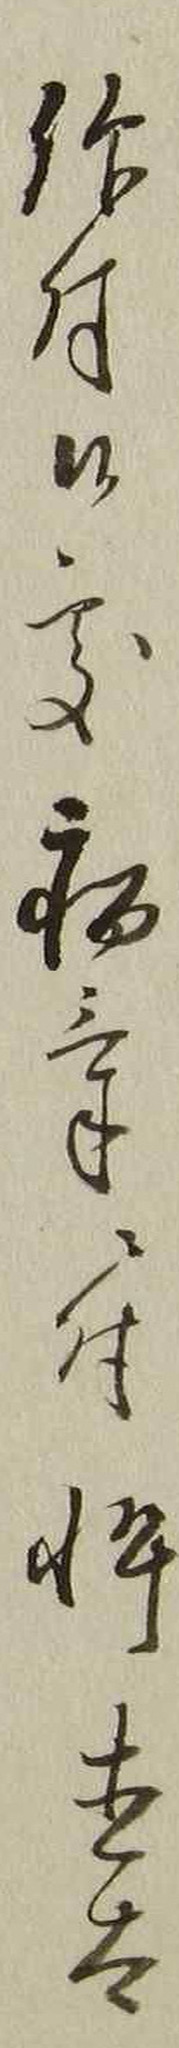仰付候処病気ニ付忰直太
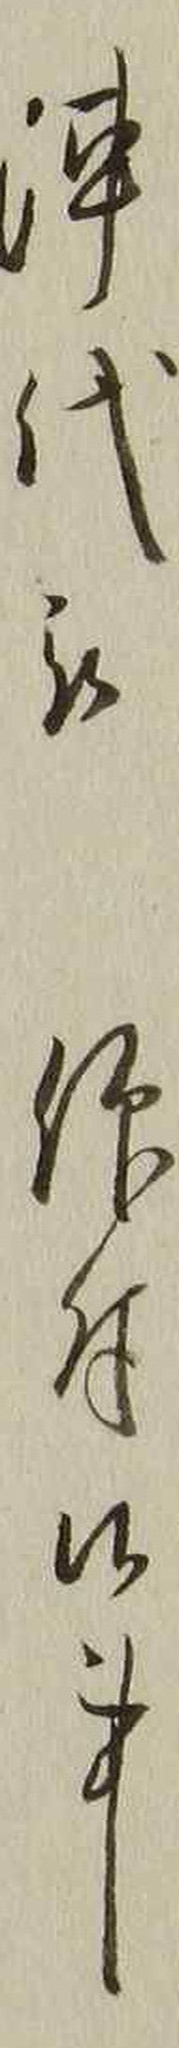陣代被仰付候事
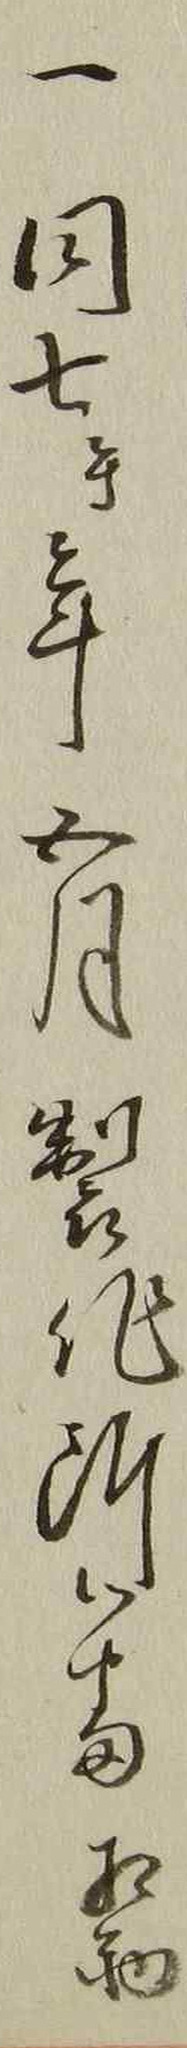一同七午年五月製作所御番相勤
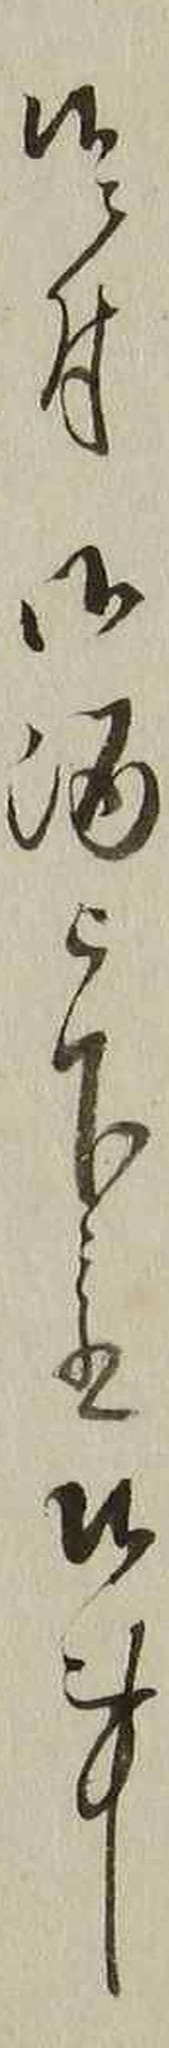候ニ付御酒被下置候事
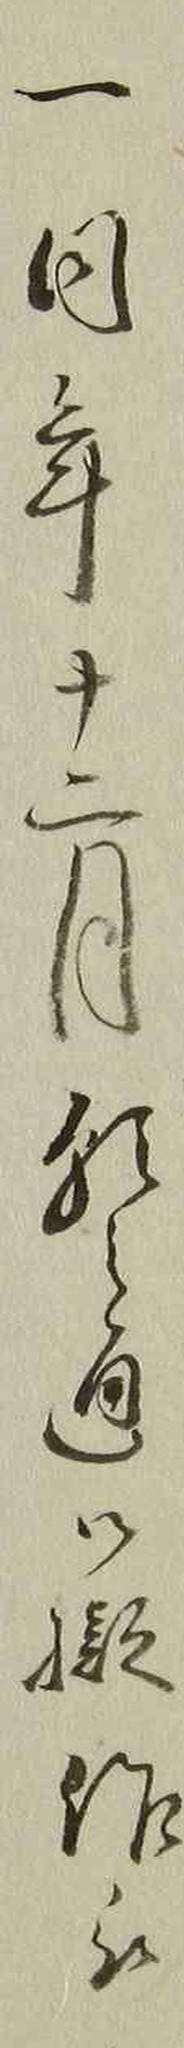一同年十二月願之通御擬作被
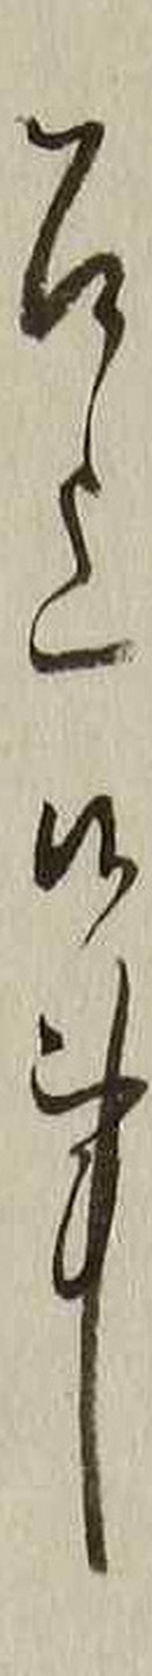召上候事
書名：諸士系譜　巻之132　た之部8
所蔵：会津若松市立会津図書館
